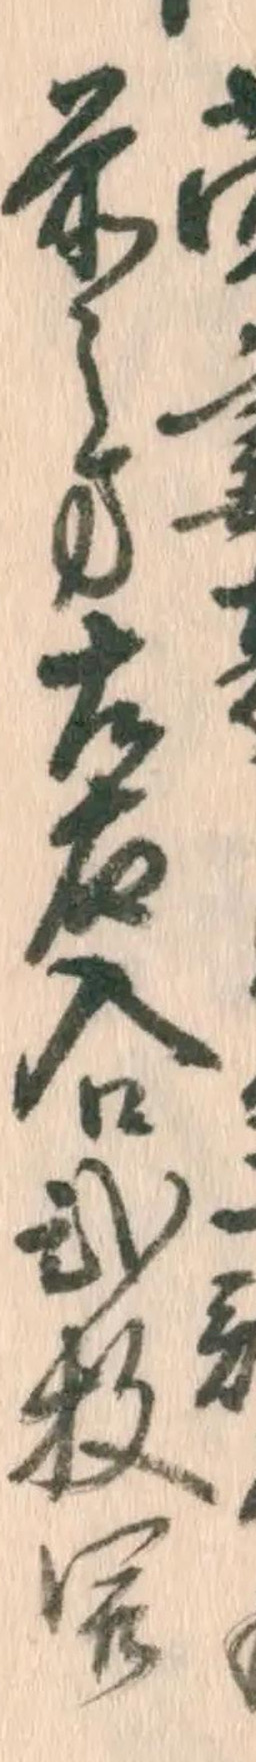前之方左右入口弐枚開
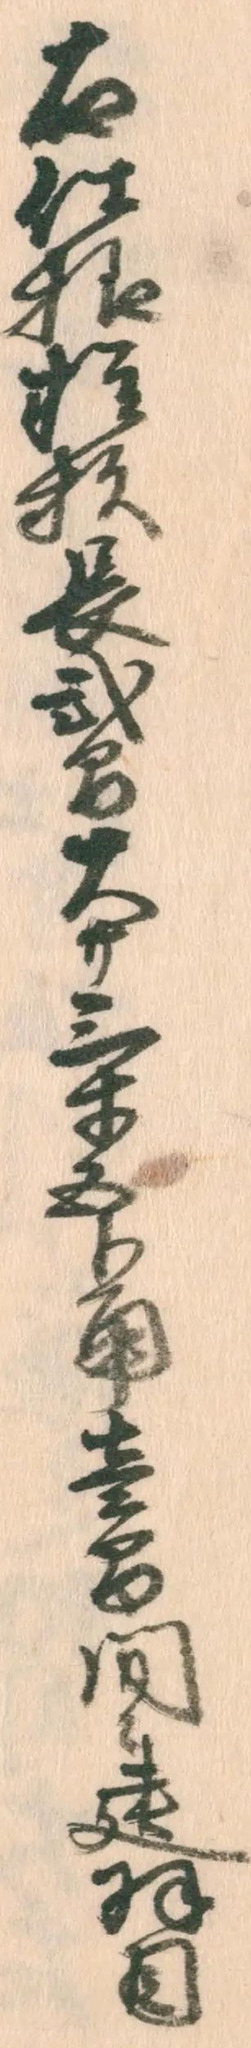右仕様柱杉長弐間太三寸五分角壱間間之建羽目
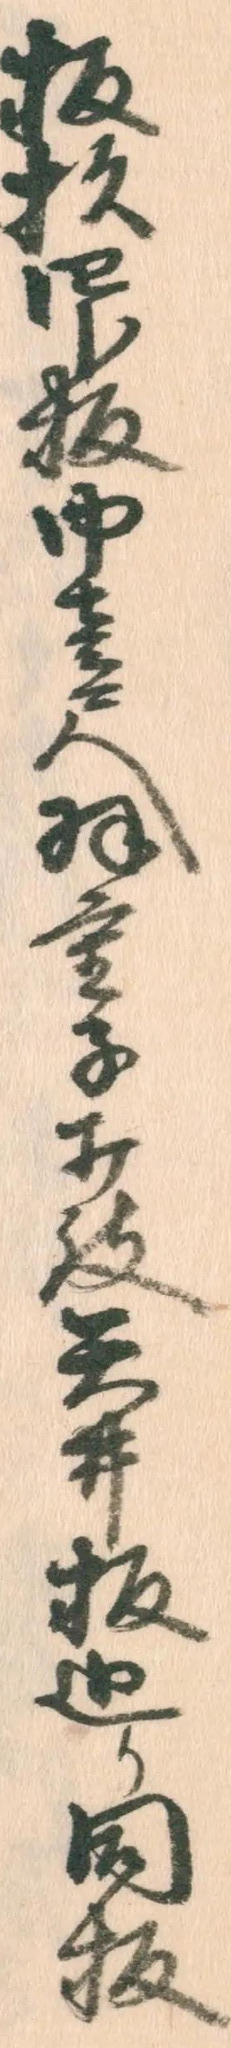板杉四分板巾壱尺羽重ね打致天井板廻り同板
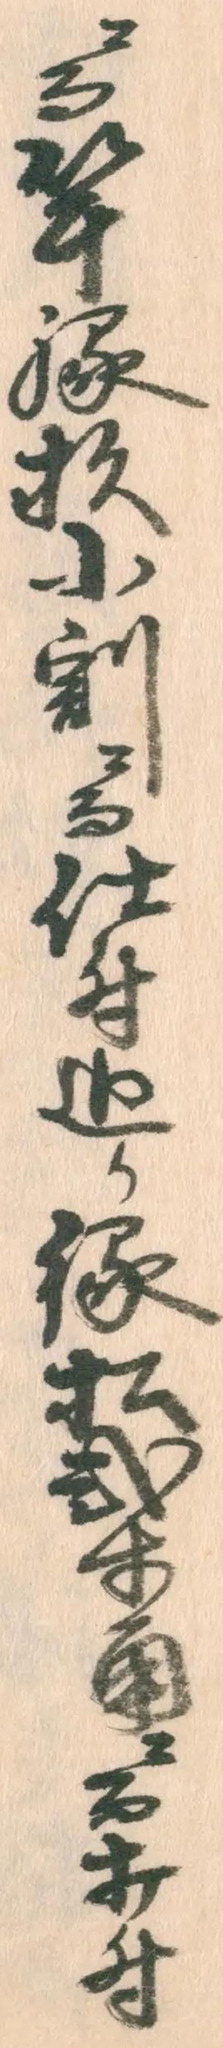に而竿縁杉小割に而仕付廻り縁松弐寸角に而打付

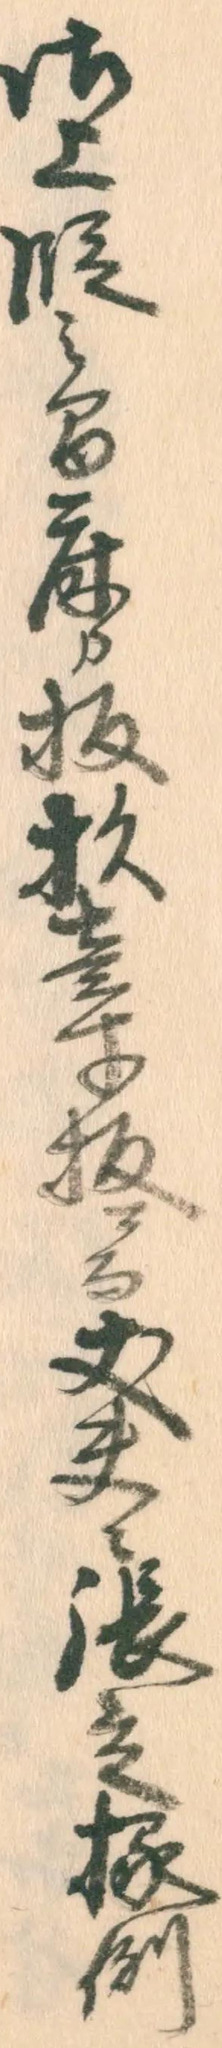御上段之間床か板杉壱寸板に而丈夫に張立縁側
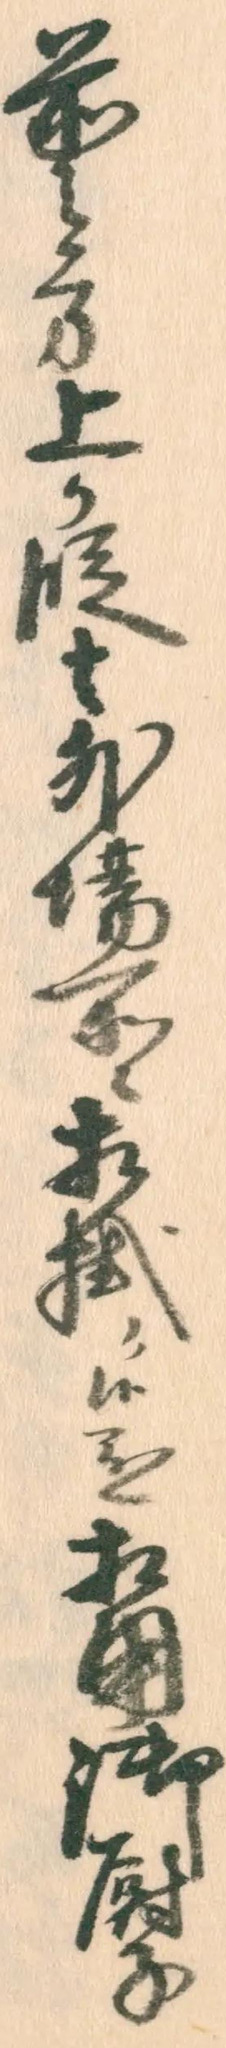前之方上り段其外場所に相掛り候を相用御厨子
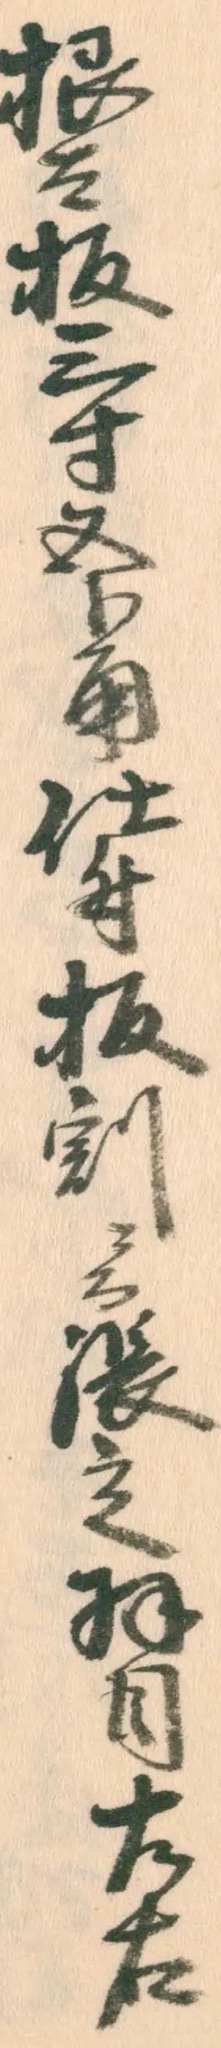根太板三寸五分角仕付板割に而張立羽目左右
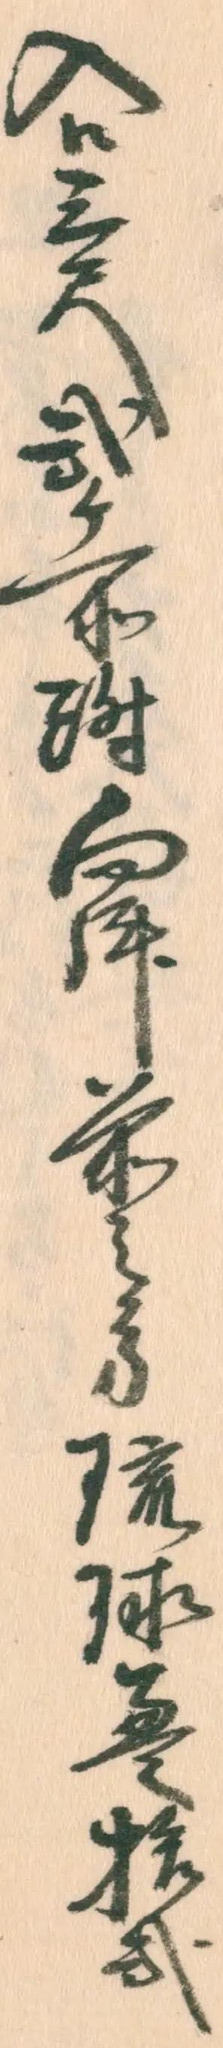入口三尺弐ヶ所附向拝前之方琉球畳拾弐
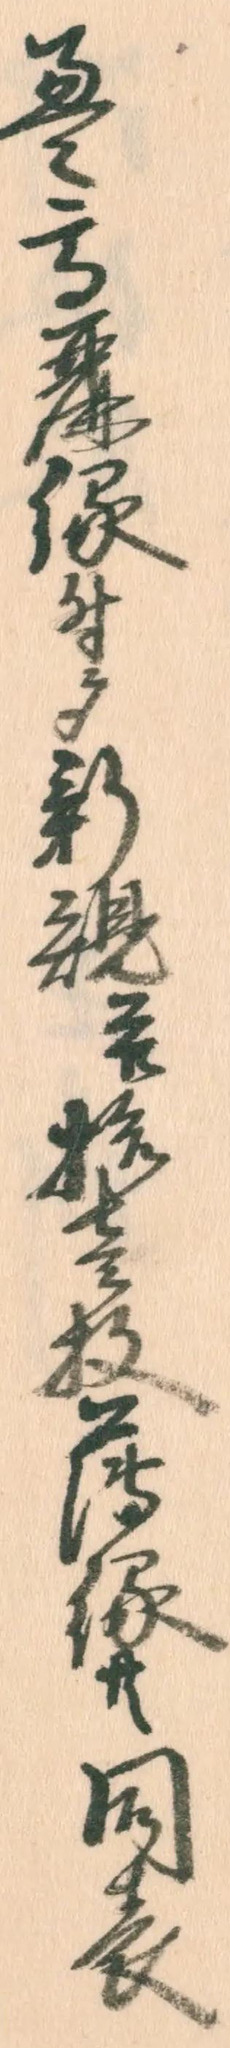畳高麗縁付にして新規并拾壱枚薄縁共同表
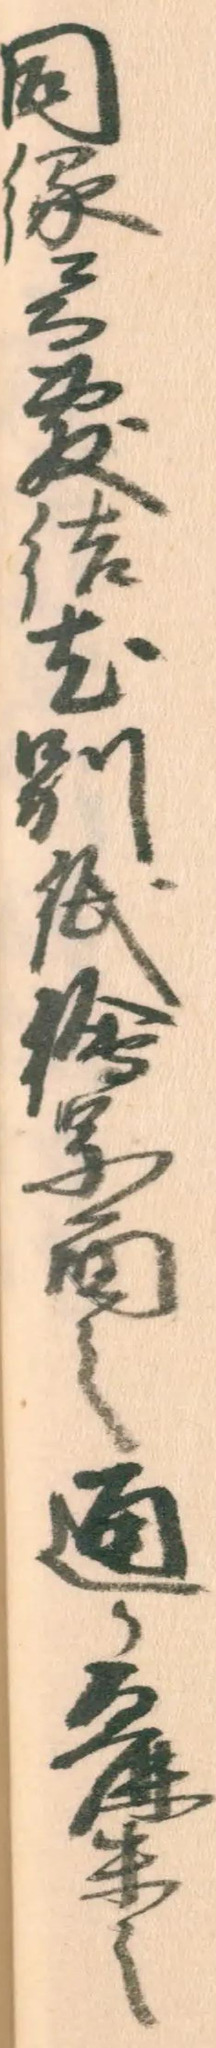同縁に而敷詰尤別紙絵図面之通り麁末之
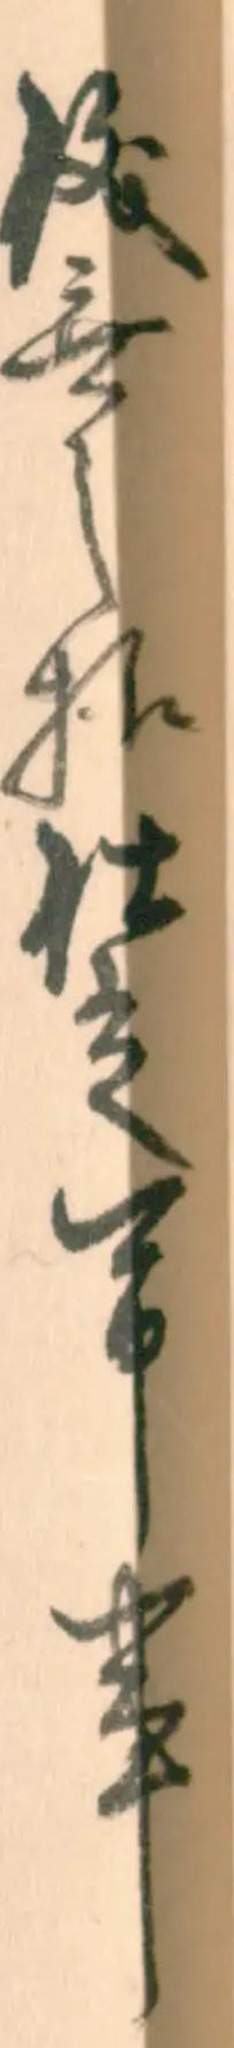儀無之様仕立可申事
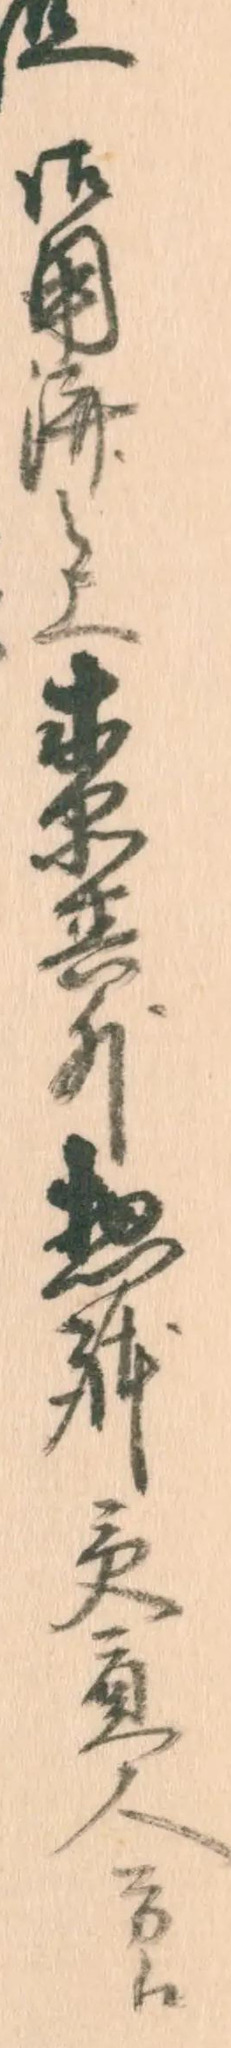但御用済之上木品其外惣躰請負人方え
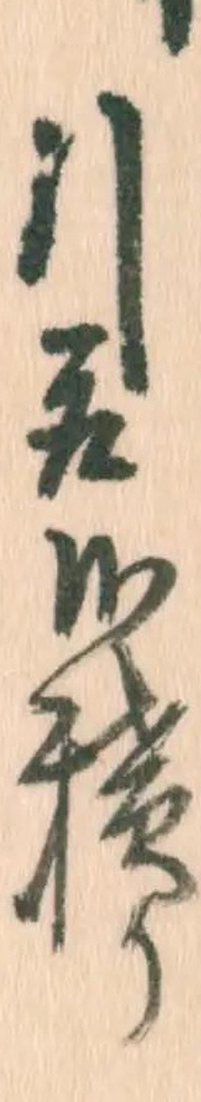引取候積り

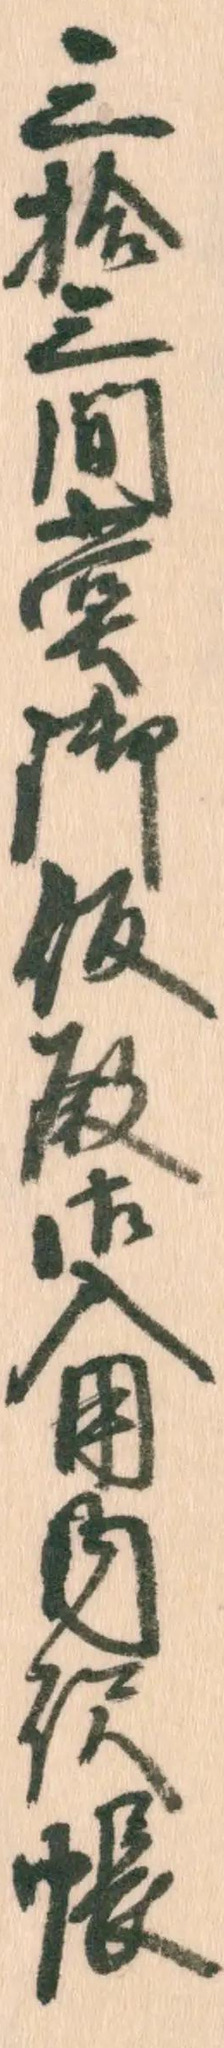三拾三間堂御仮殿御入用内訳帳

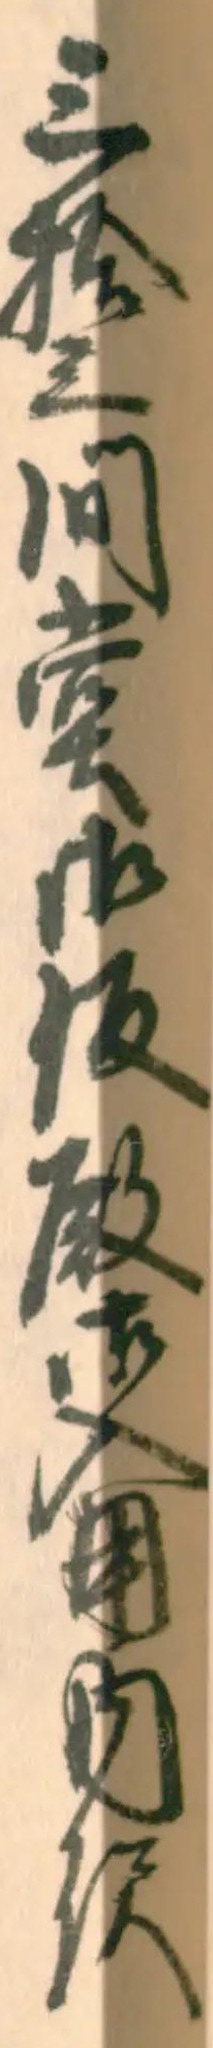三十三間堂御仮殿御入用内訳
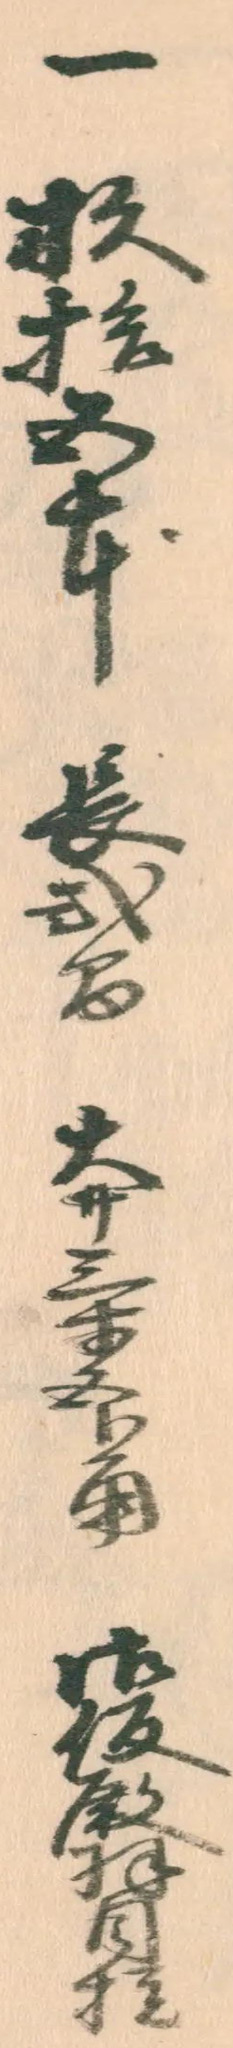一杉拾五本長弐間大サ三寸五分角御仮殿羽目柱
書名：三十三間堂. [1]
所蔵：国立国会図書館 National Diet Library, JAPAN
